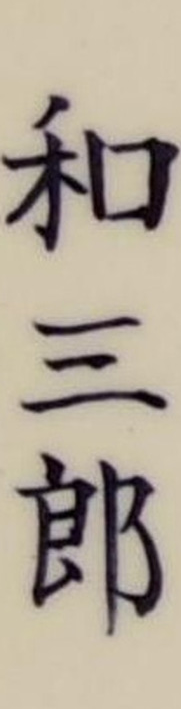和三郎
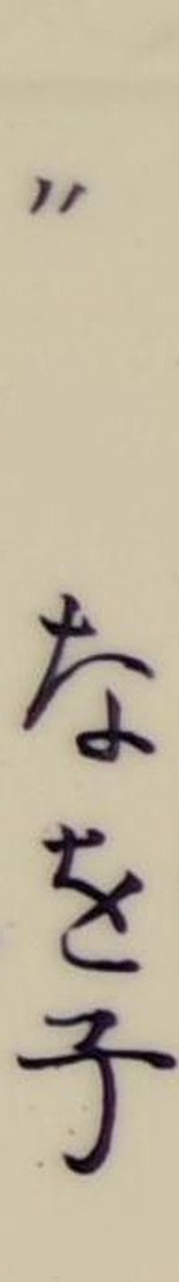なを子
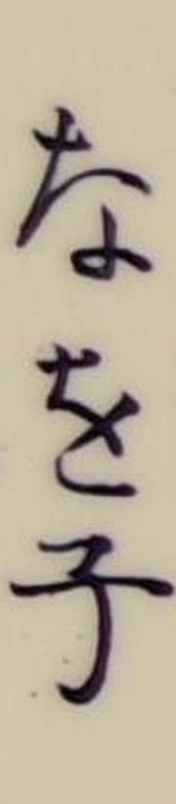なを子
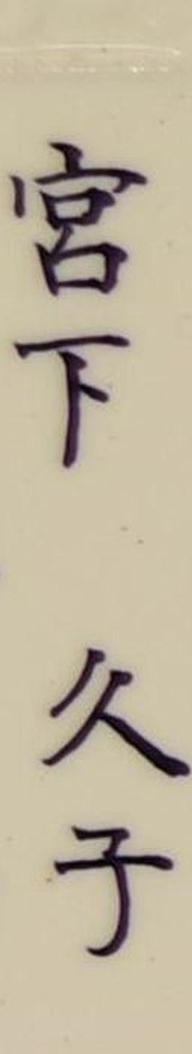宮下久子
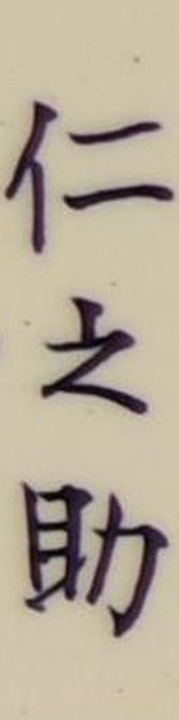仁之助

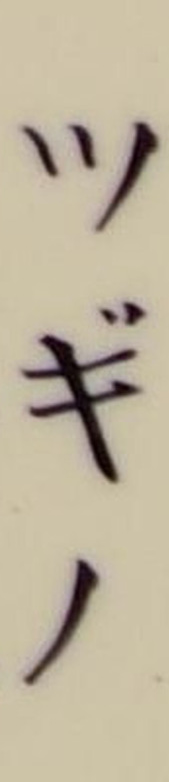ツギノ
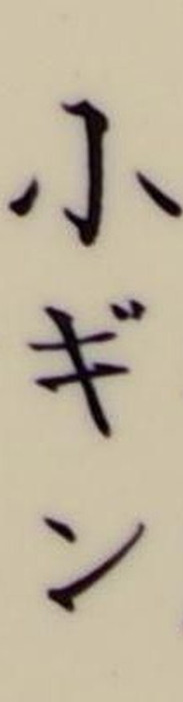小ギン
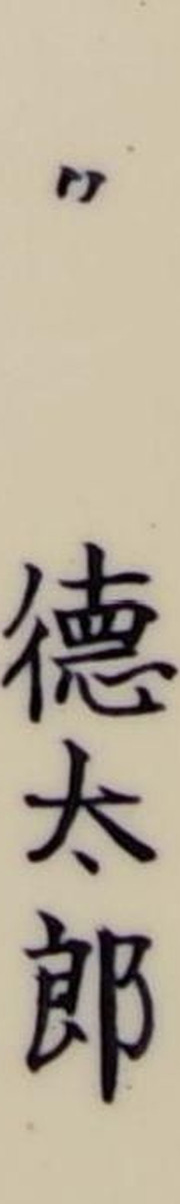徳太郎
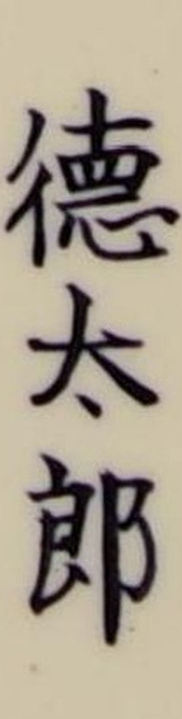徳太郎
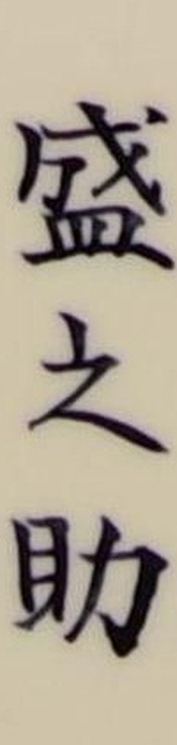盛之助
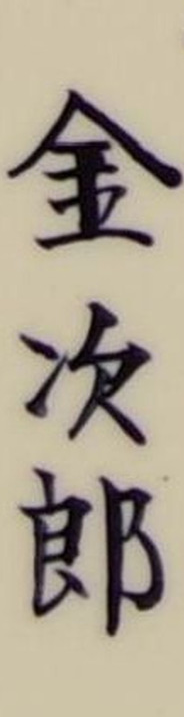金次郎
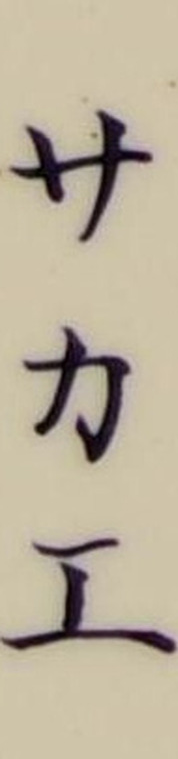サカエ
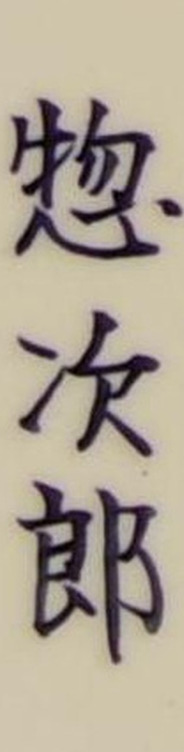惣次郎

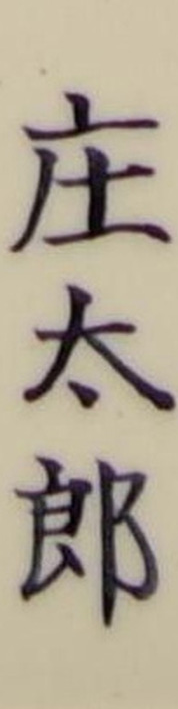庄太郎
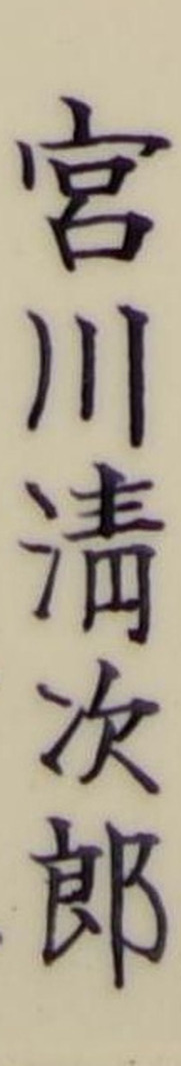宮川清次郎
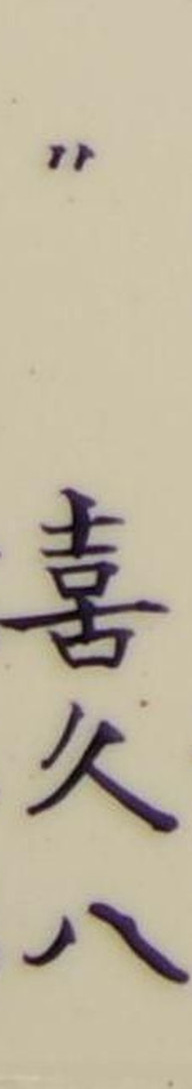喜久八
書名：E~L
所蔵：高野山金剛峯寺
